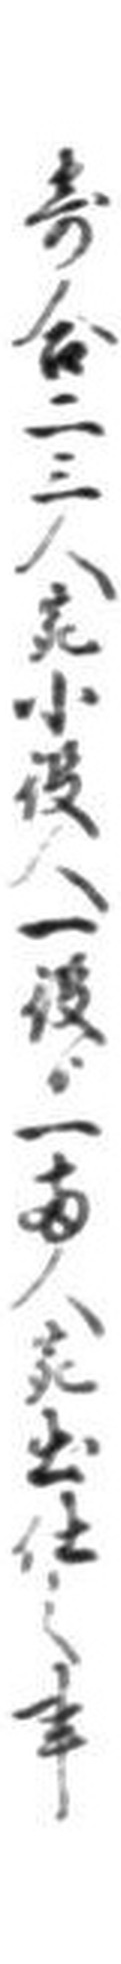寄合二三人宛小役人一役ゟ一両人宛出仕之事
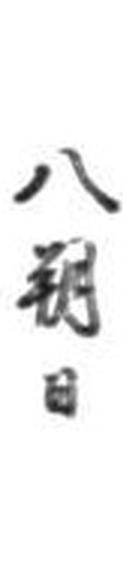八朔日
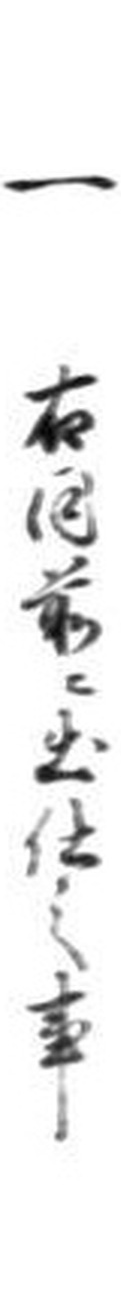一右同前ニ出仕之事
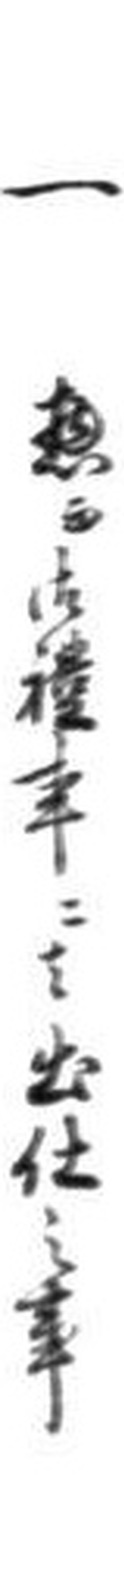一惣而御礼事ニ者出仕之事
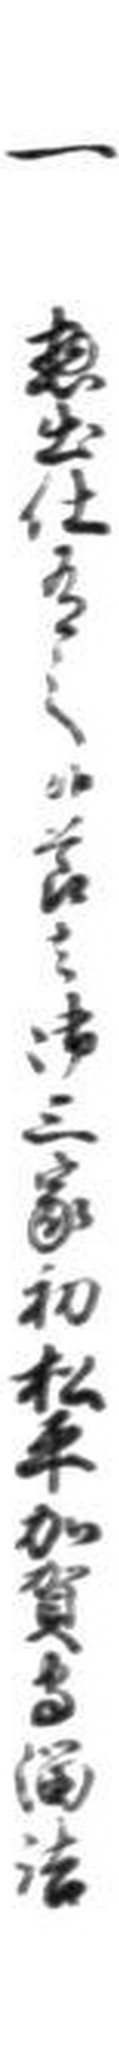一惣出仕有之候節者御三家初松平加賀守溜詰
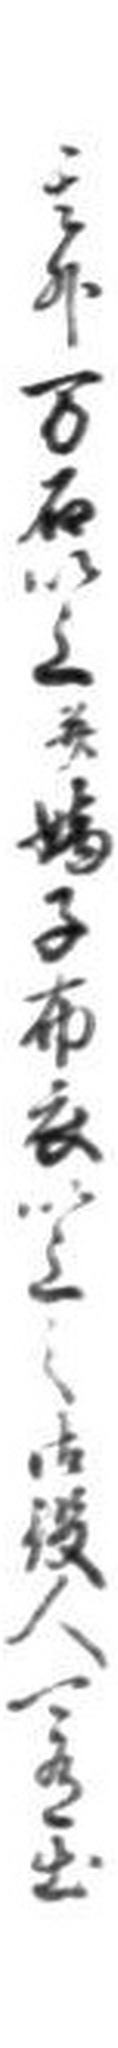其外万石以上并嫡子布衣以上之御役人可有出

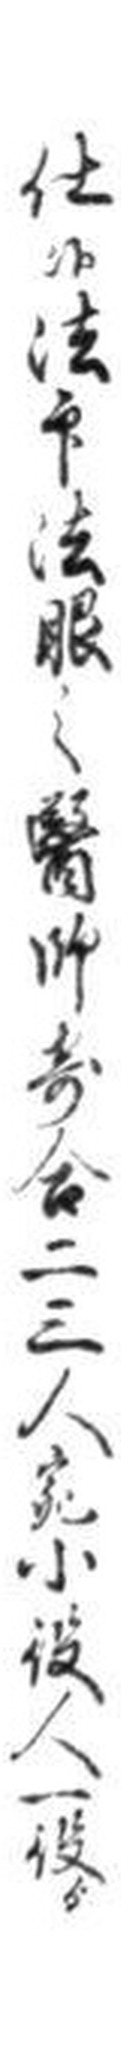仕候法印法眼之医師寄合二三人宛小役人一役ゟ
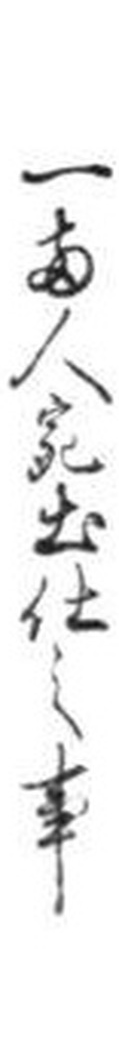一両人宛出仕之事
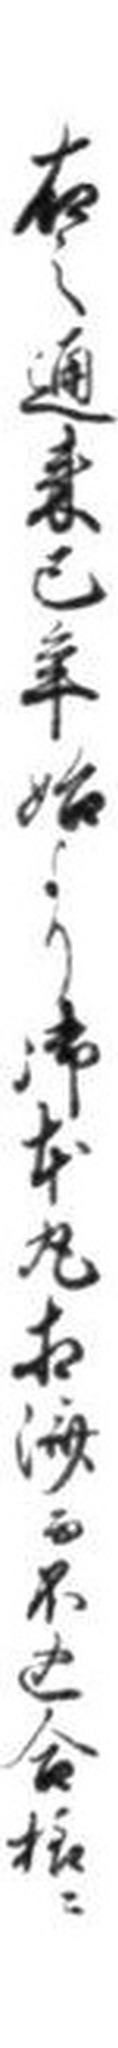右之通来巳年始より御本丸相済而不込合様ニ
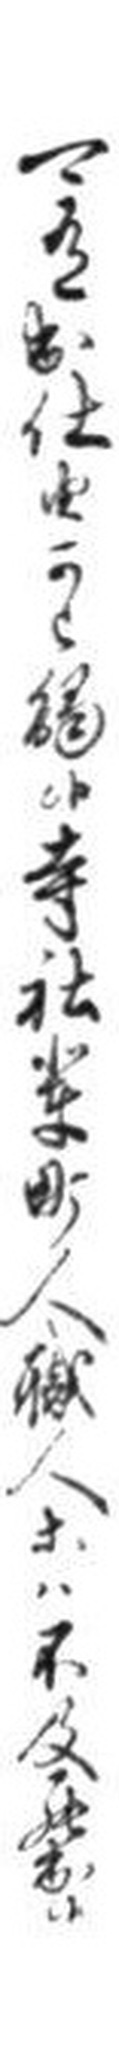可有出仕由可被触候寺社輩町人職人等ハ不及罷出候
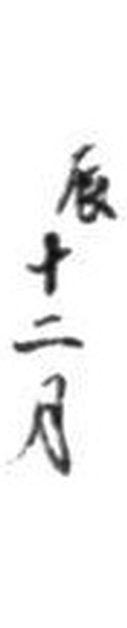辰十二月
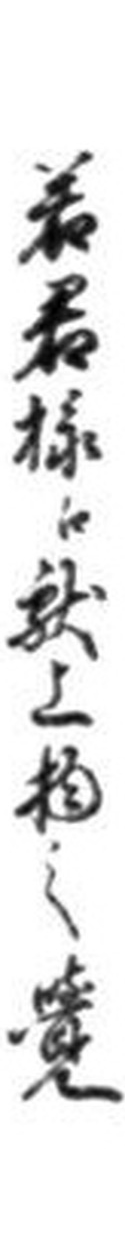若君様江献上物之覚
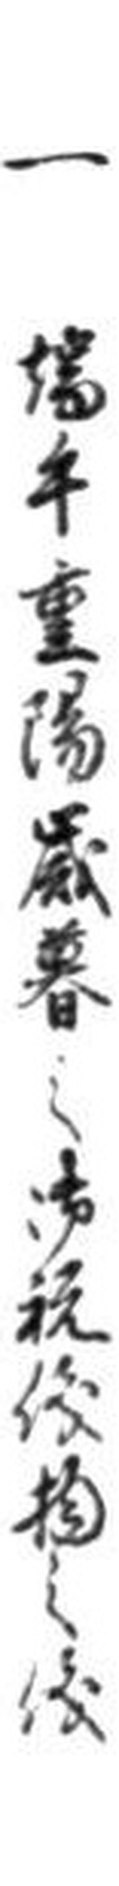一端午重陽歳暮之御祝儀物之儀
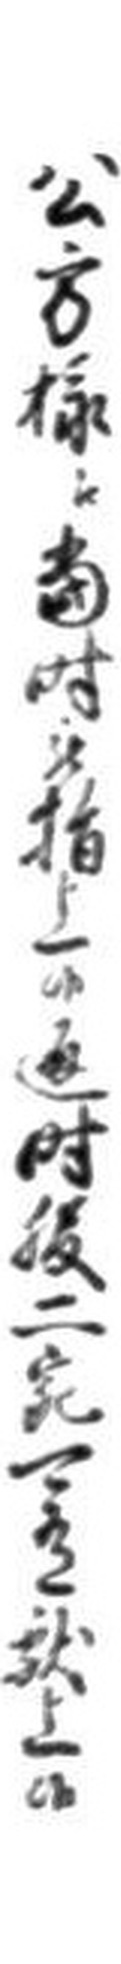公方様江当時被指上候通時服二宛可有献上候
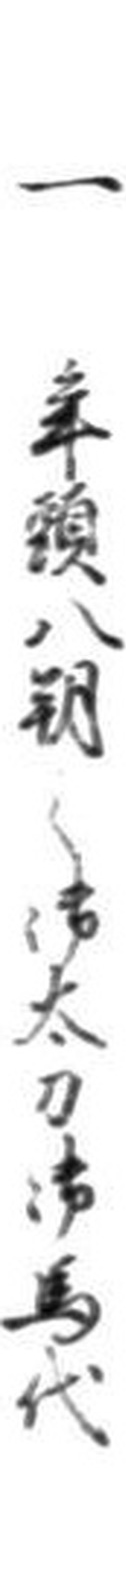一年頭八朔之御太刀御馬代
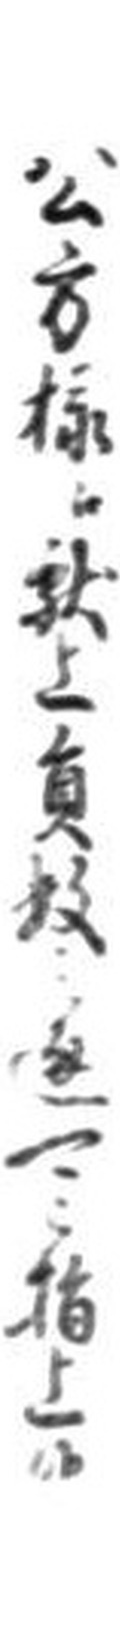公方様江献上員数之通可被指上候
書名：家譜 三十八 宗矩公 従享保九年五月到享保九年十二月
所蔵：福井県文書館 Fukui Prefectural Archives
